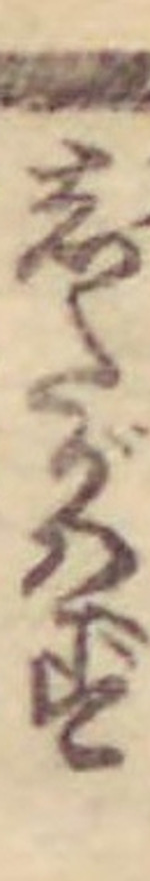したがはず
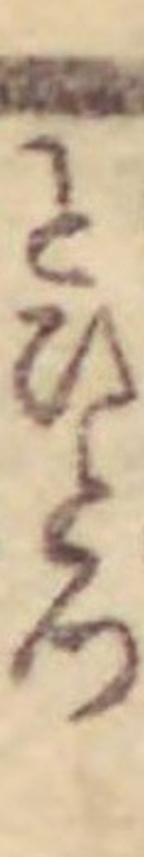とひとつ
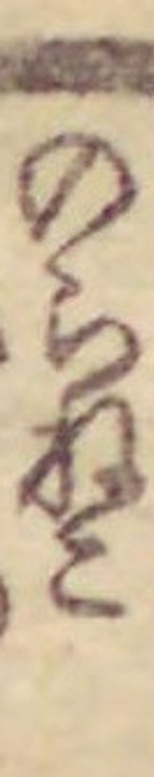のらねこ
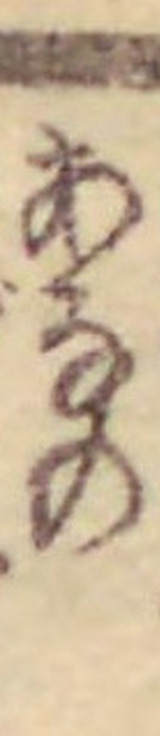あなの
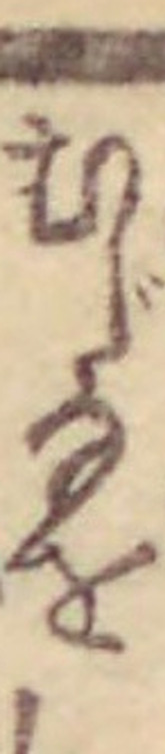むじなを
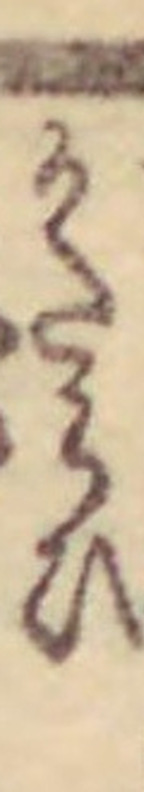かたらひ
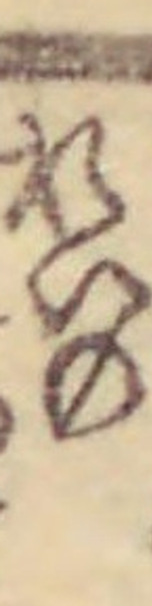れいの
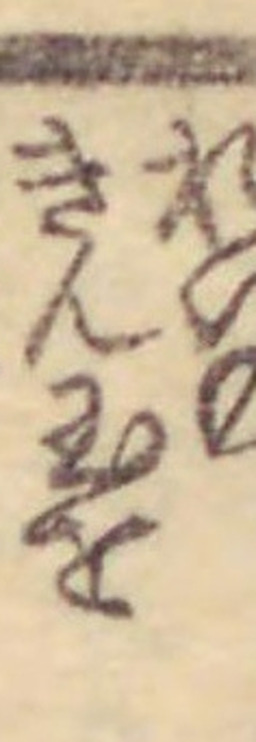きん玉を
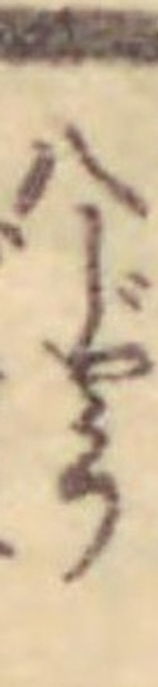八じやう
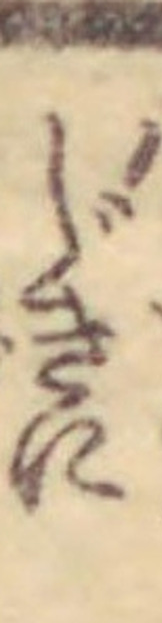じきに
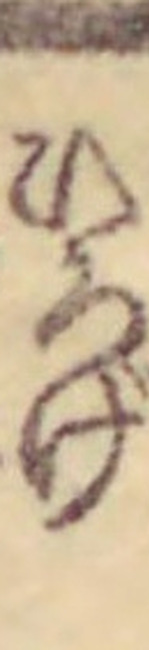ひろげ
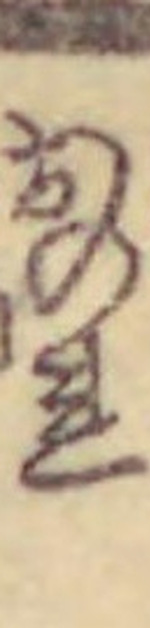おのれ
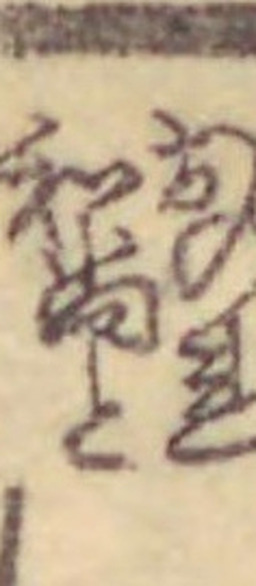和尚と
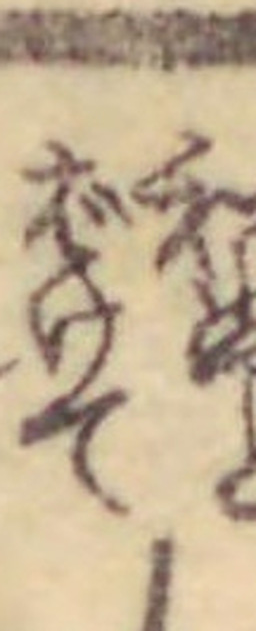ばけて
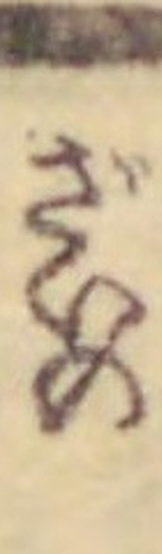ざいの
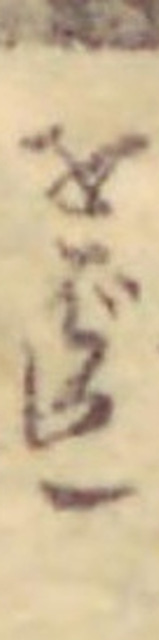をばかし
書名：化物世帯氣質
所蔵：国立国会図書館 National Diet Library, JAPAN
